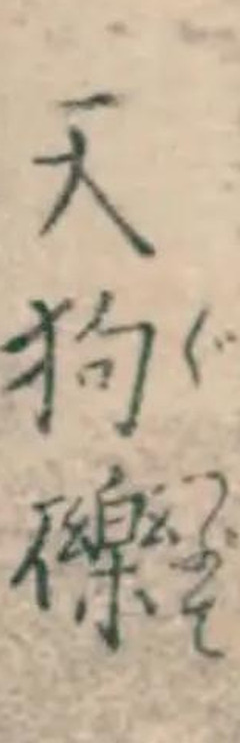天狗礫
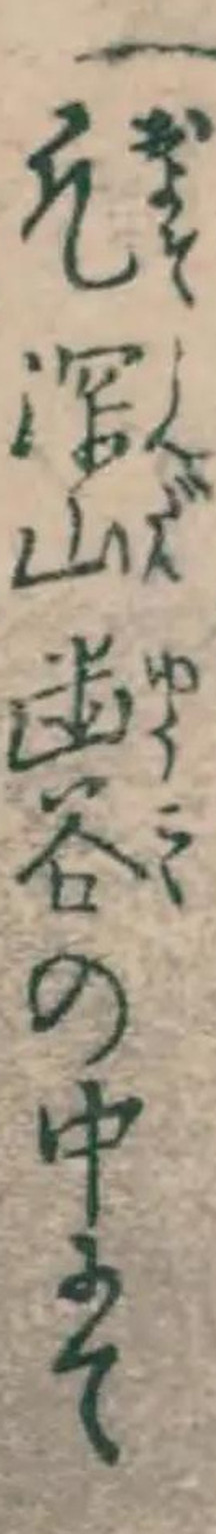凡深山幽谷の中にて
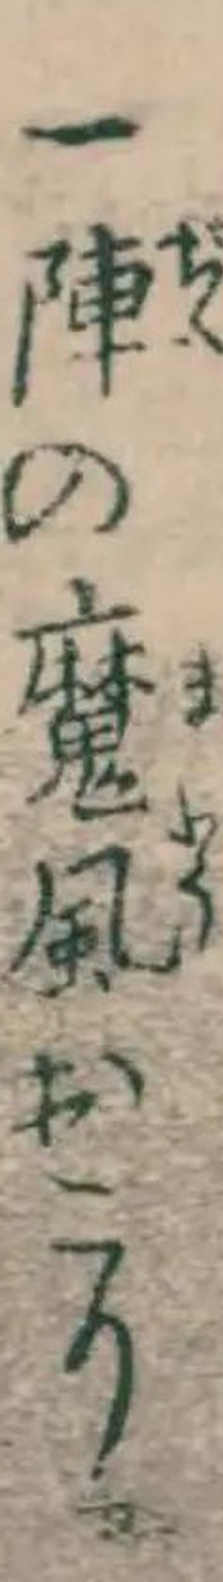一陣の魔風おこり
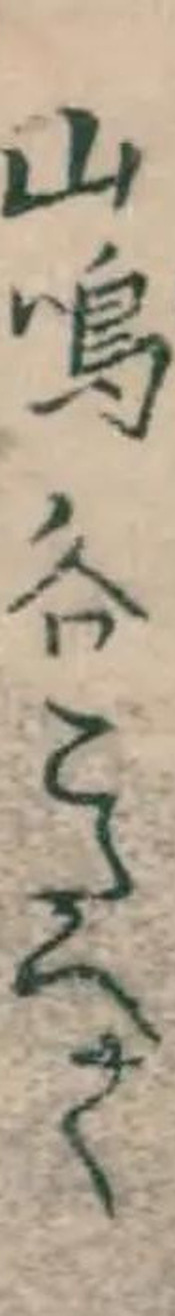山鳴谷こたへて
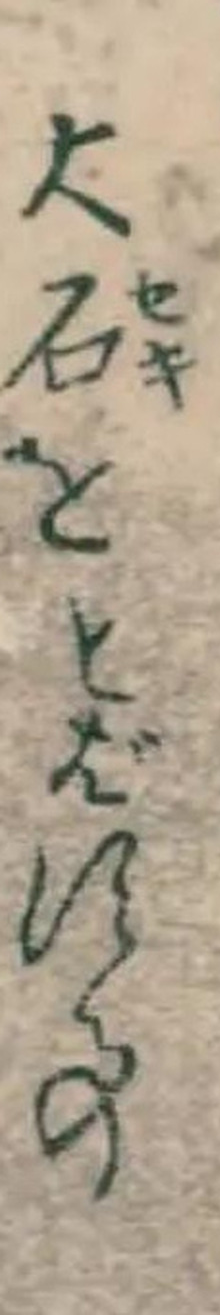大石をとばす事
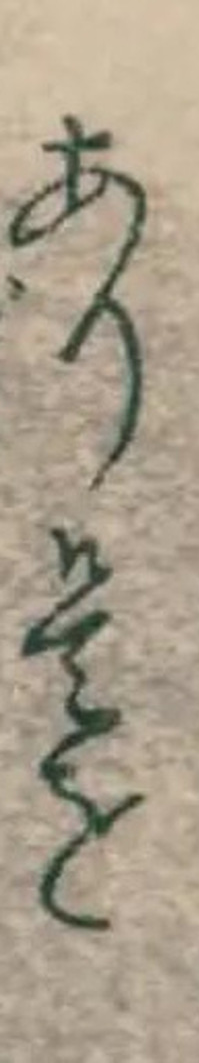あり是を
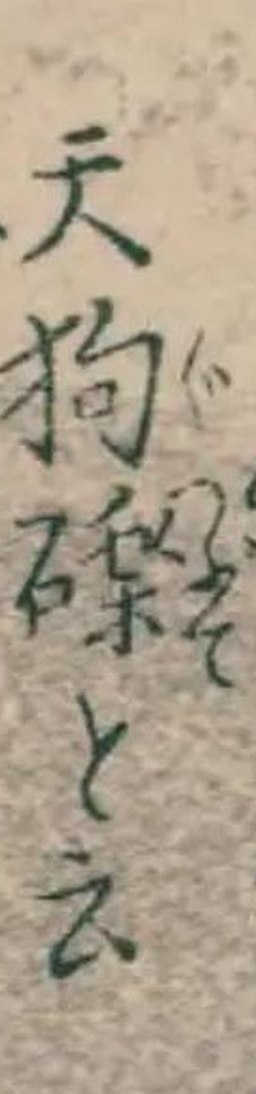天狗礫と云
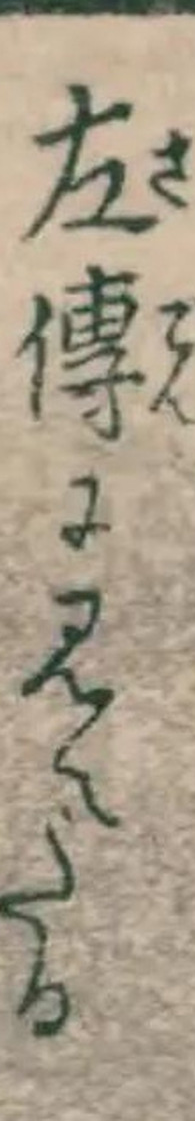左伝に見へたる
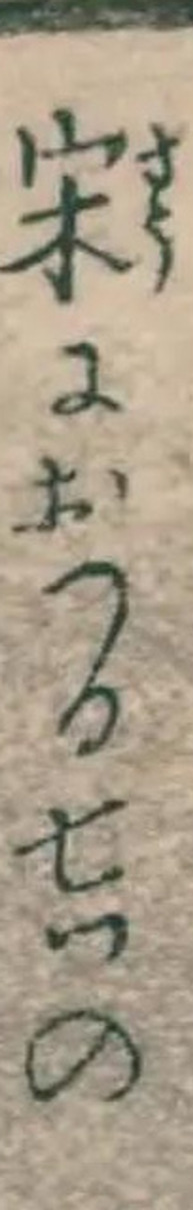宋におつる七つの
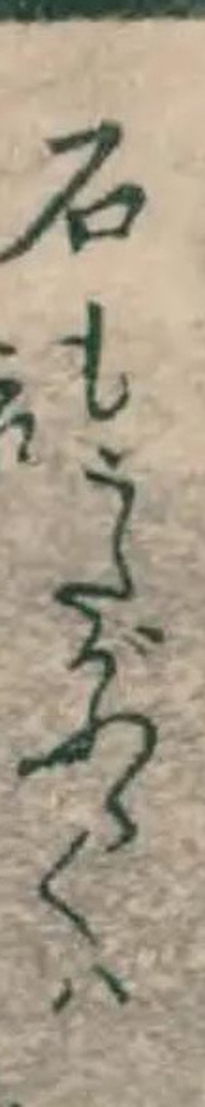石もうたがふらくは
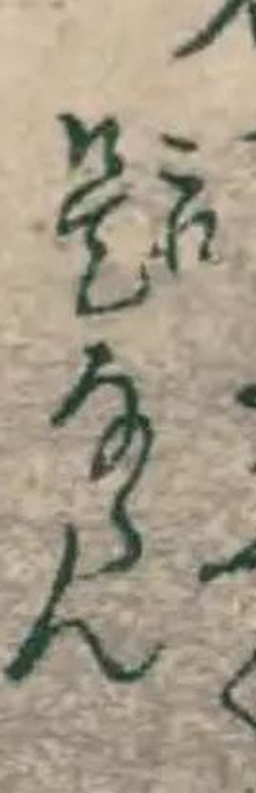是ならん

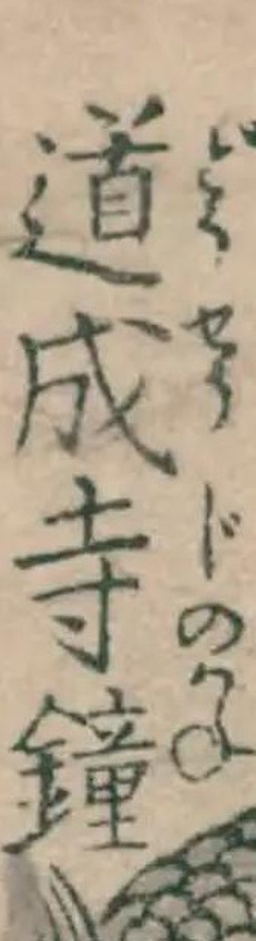道成寺鐘
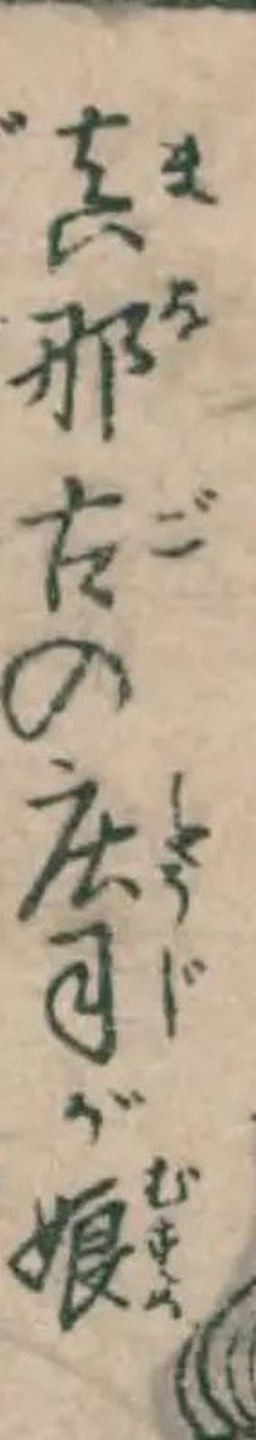真那古の庄司が娘
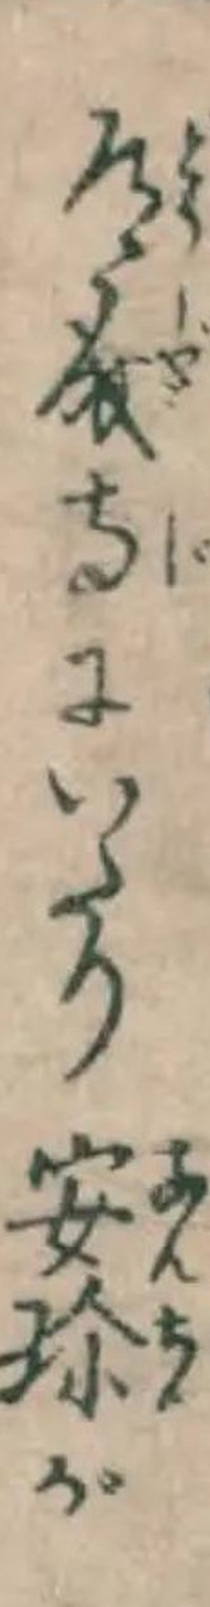道成寺にいたり安珍が
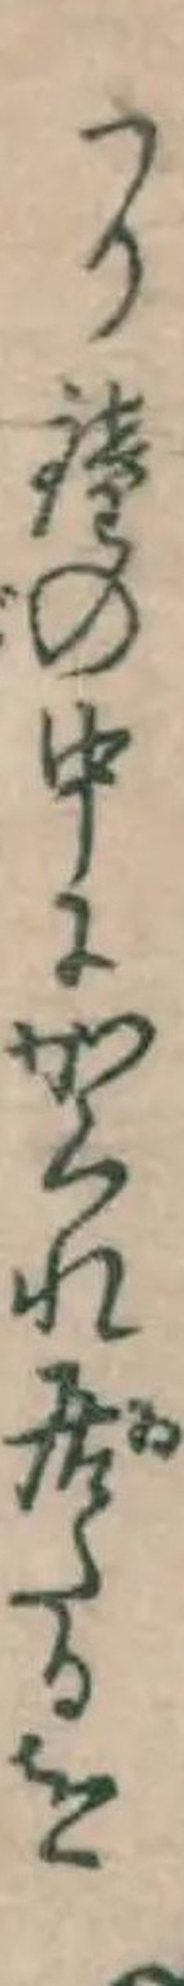つり鐘の中にかくれ居たるを
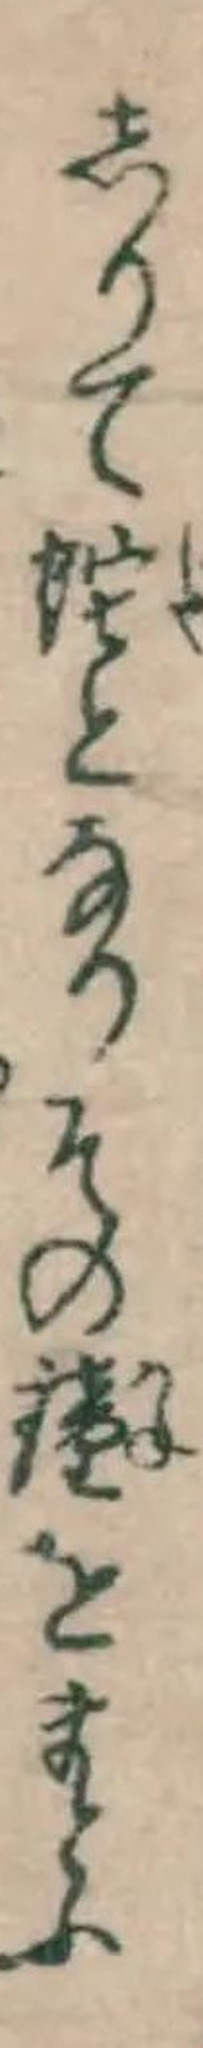しりて蛇となりその鐘をまとふ
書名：百鬼夜行 3巻拾遺3巻. [2]
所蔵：国立国会図書館 National Diet Library, JAPAN
